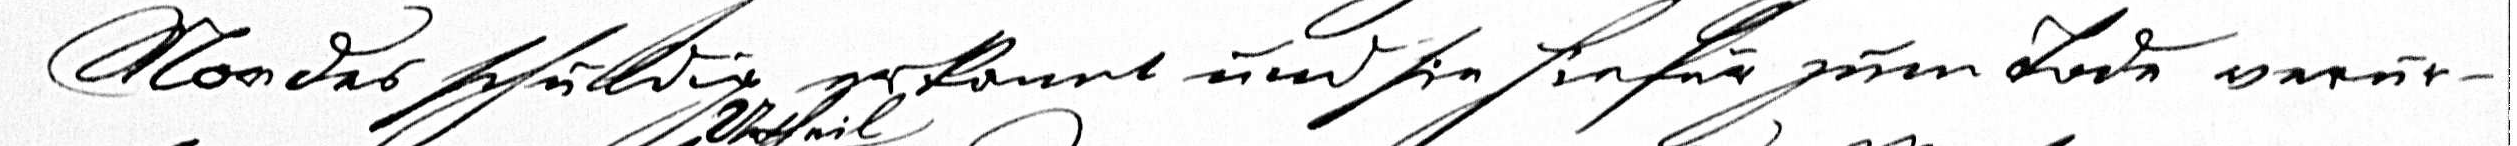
Mordes schuldig erkannt und sie hiefür zum Tode verur¬
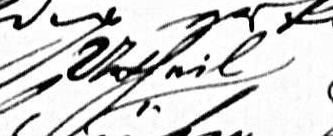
Urtheil
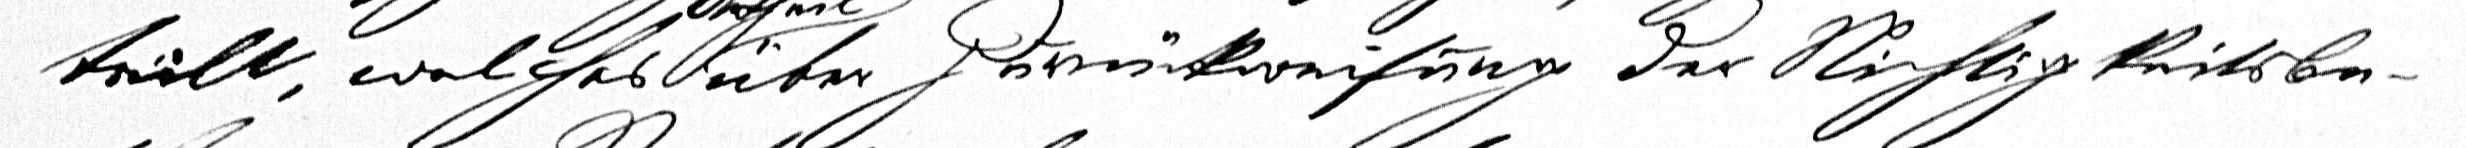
teilt, welches über Zurückweisung der Nichtigkeitsbe¬
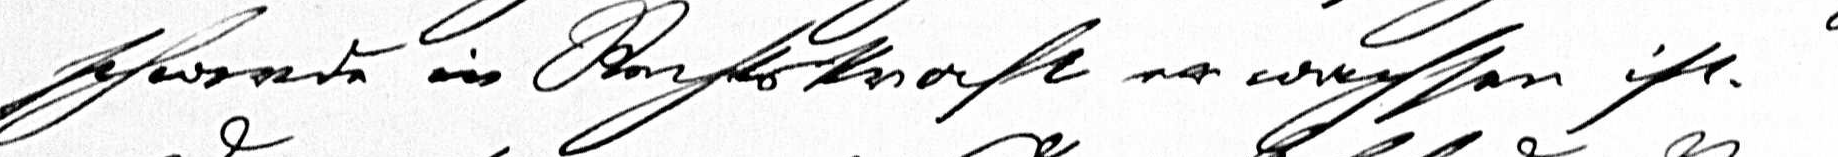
schwerde in Rechtskraft erwachsen ist.
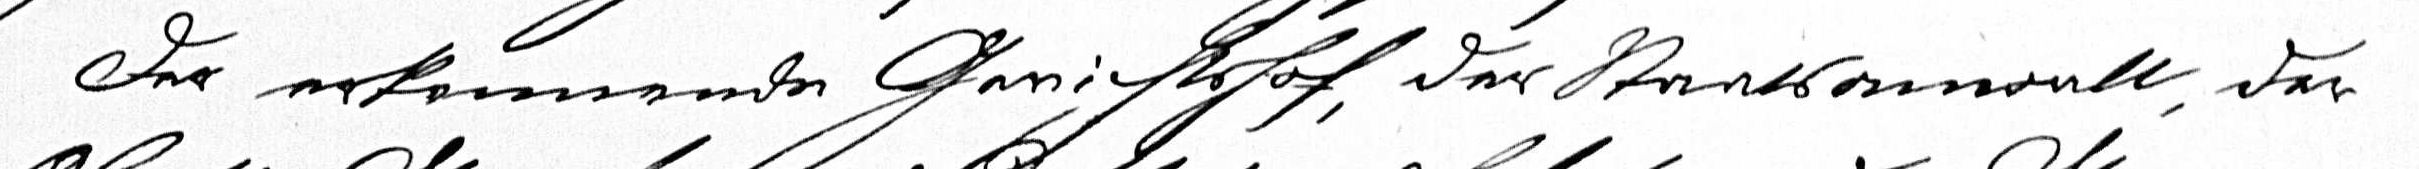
Der erkennende Gerichtshof, der Staatsanwalt, der
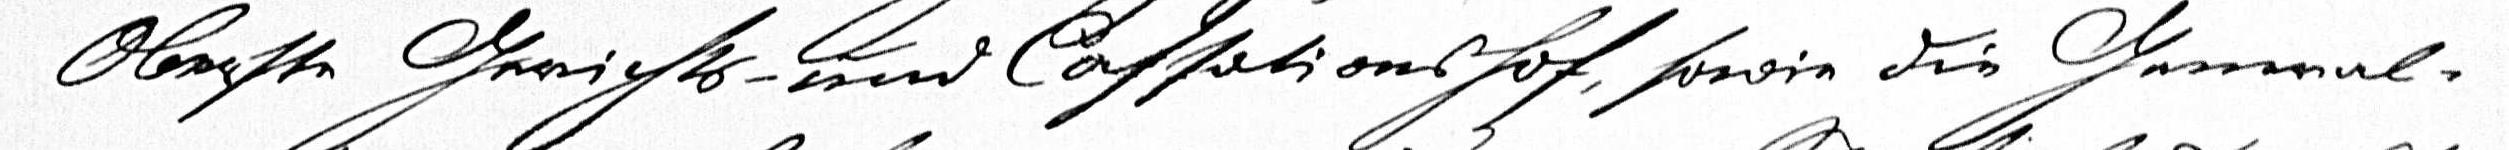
Oberste Gerichts- und Cassationshof, sowie die General¬
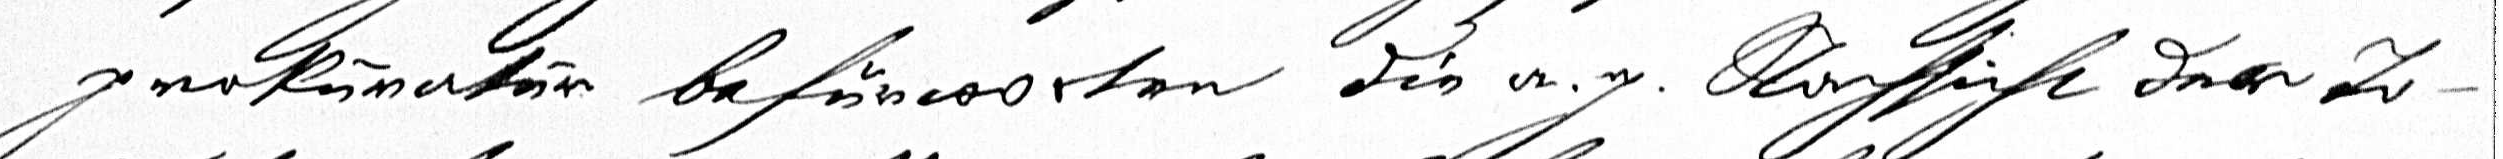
prokuratur befürworten die a.g. Nachsicht der To¬
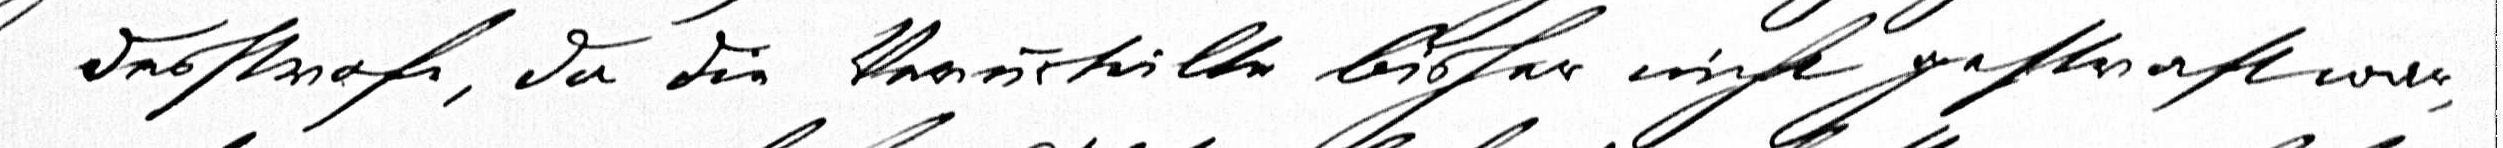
desstrafe, da die Verurtheilte bisher nicht gestraft war
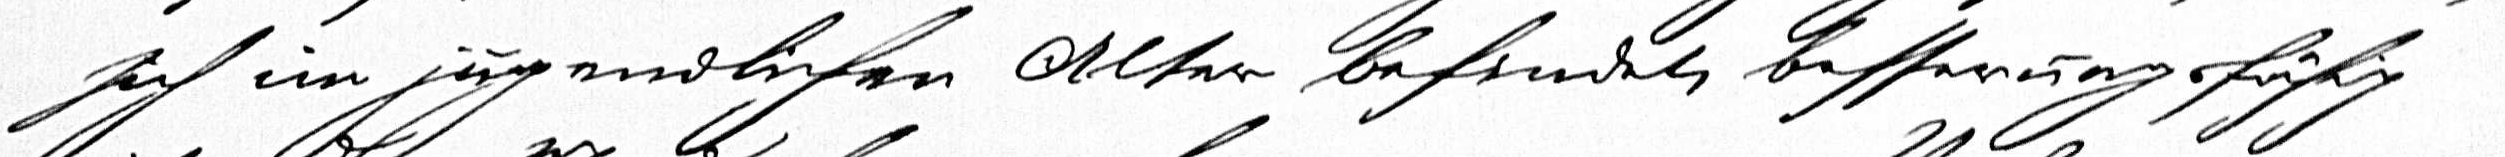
sich im jugendlicher Alter befindet, besserungsfähig
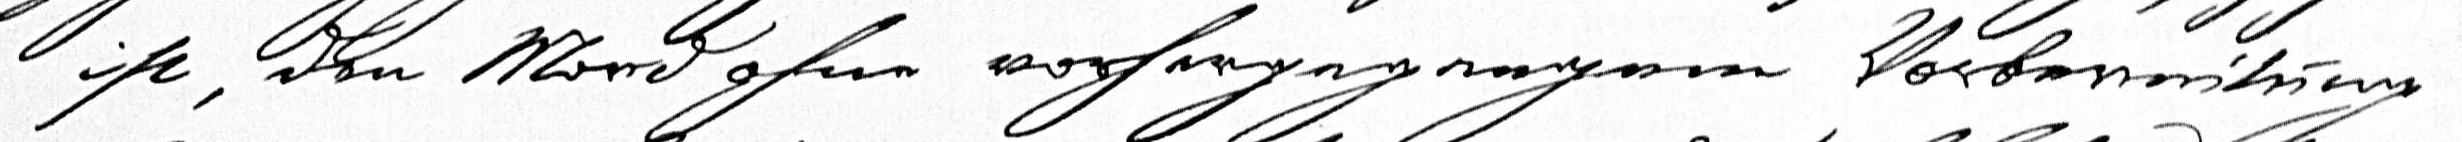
ist, den Mord ohne vorhergegange Vorbereitung
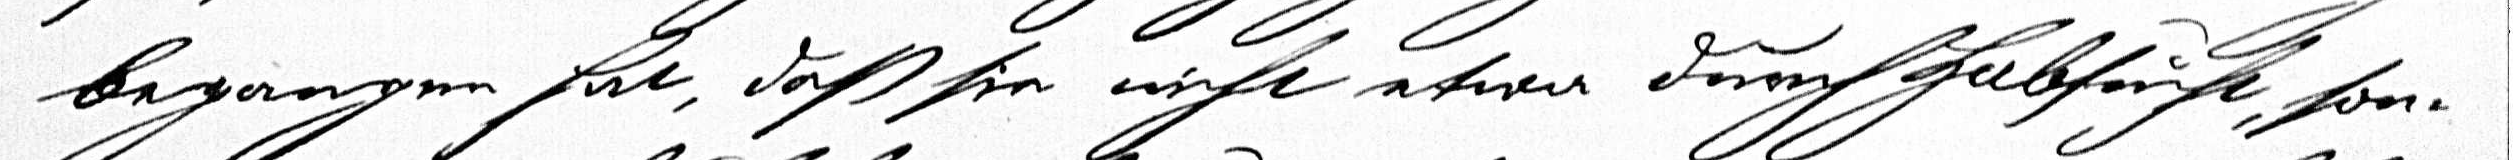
begangen hat, daß sie nicht etwa durch Habsucht, son¬
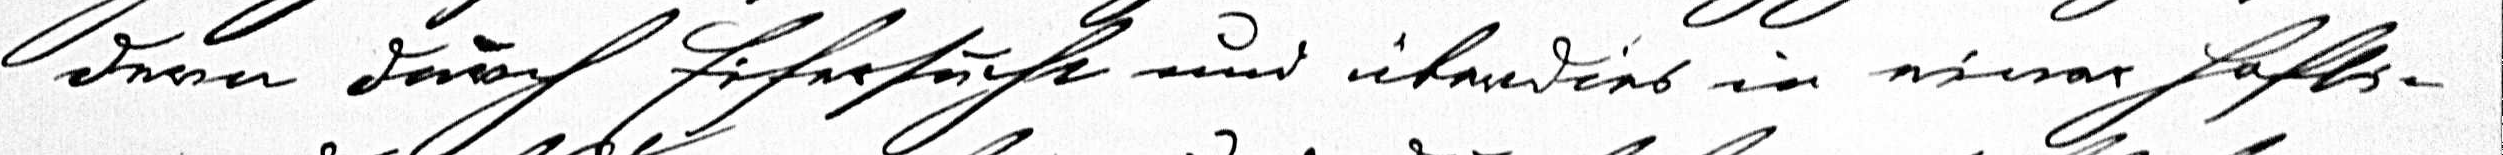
dern durch Eifersucht und überdies in einer hefti¬
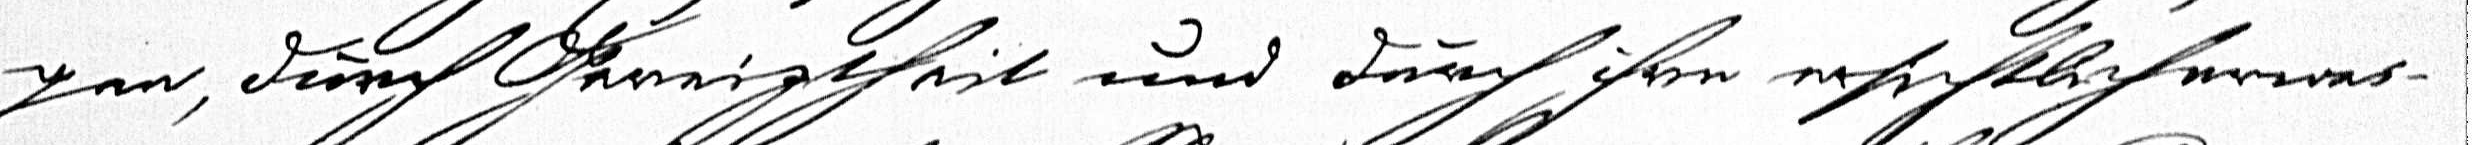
gen, durch Gereiztheit und durch ihre ersichtlicherwei¬
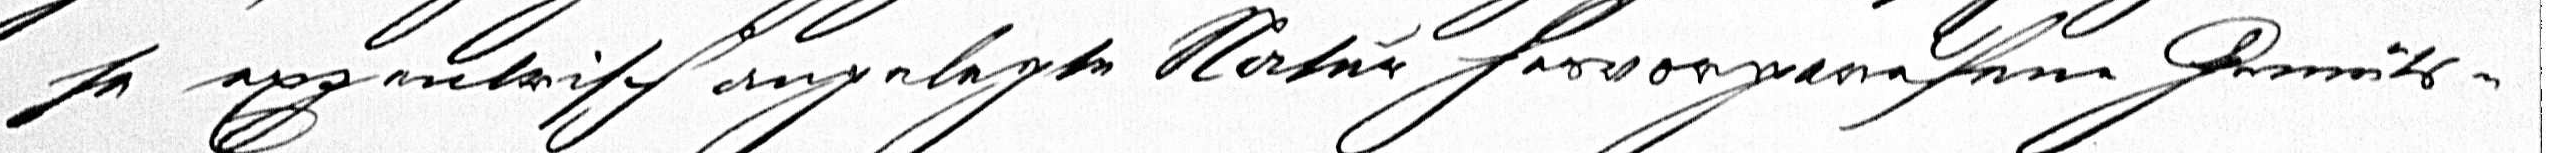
se exzentrisch angelegte Natur hervorgerathene Gemüts¬
